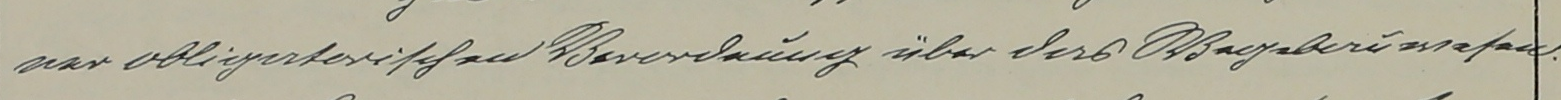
ner obligatorischen Verordnung über das Wegebauwesen.
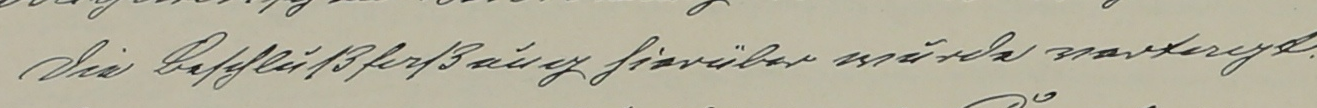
Die Beschlußfaßung hierüber wurde vertagt.
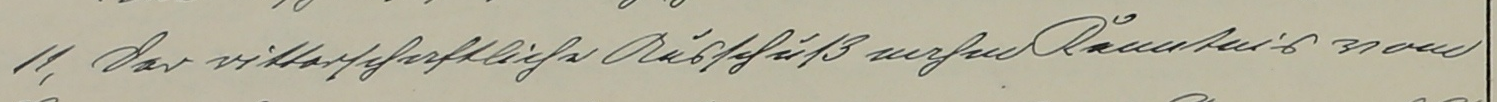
11. Der ritterschaftliche Ausschuß nahm Kenntnis vom
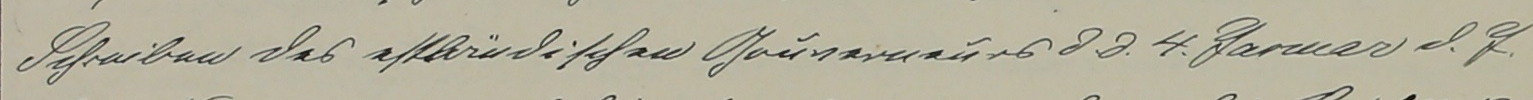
Schreiben des estländischen Gouverneurs d.d. 4. Januar d.J.
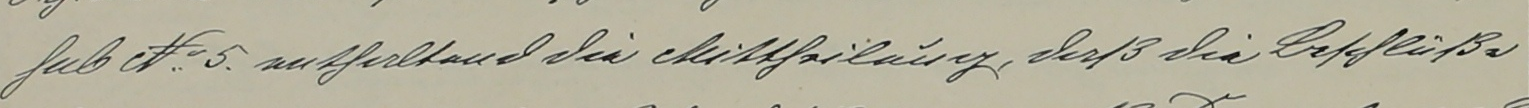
sub No. 5. enthaltend die Mitteilung, daß die Beschlüße
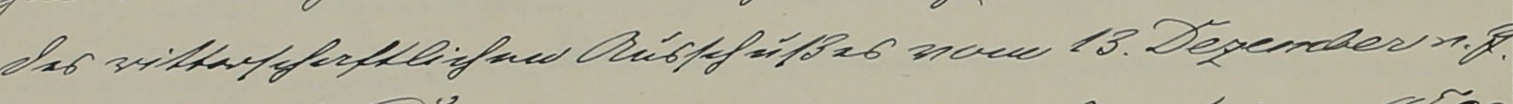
des Ritterschaftlichen Ausschußes vom 13. Dezember v.J.
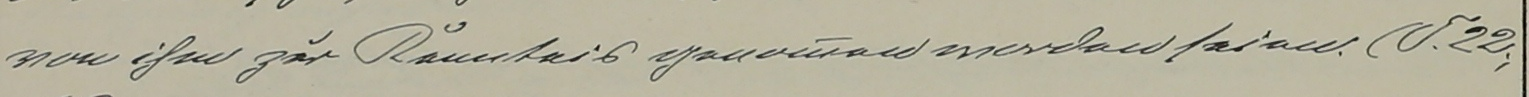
von ihm zur Kenntnis genommen worden seien (T.22;
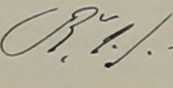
R.1).
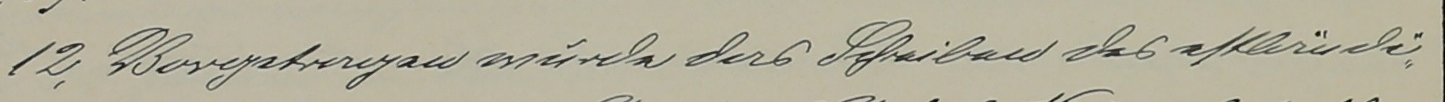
12. Vorgetragen wurde das Schreiben des estländi-
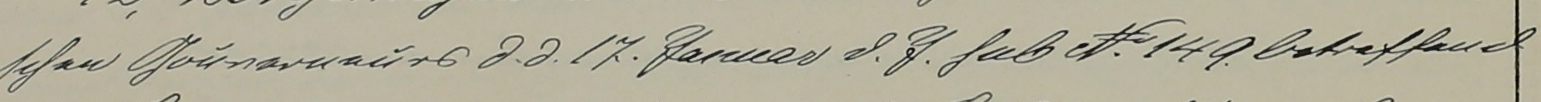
schen Gouverneurs d.d. 17. Januar d.J. sub No.149. betreffend
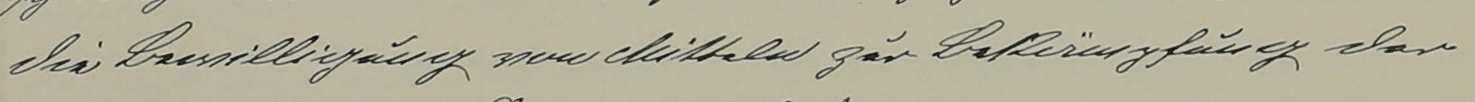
die Bewilligung von Mitteln zur Bekämpfung der
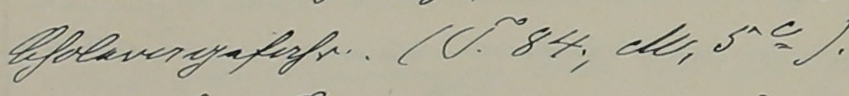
Choleragefahr. (T.84; M.5c).
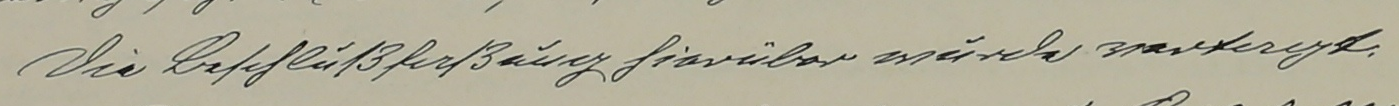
Die Beschlußfaßung hierüber wurde vertagt.
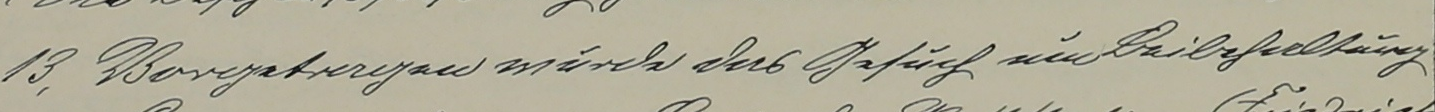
13. Vorgetragen wurde das Gesuch um Beibehaltung
